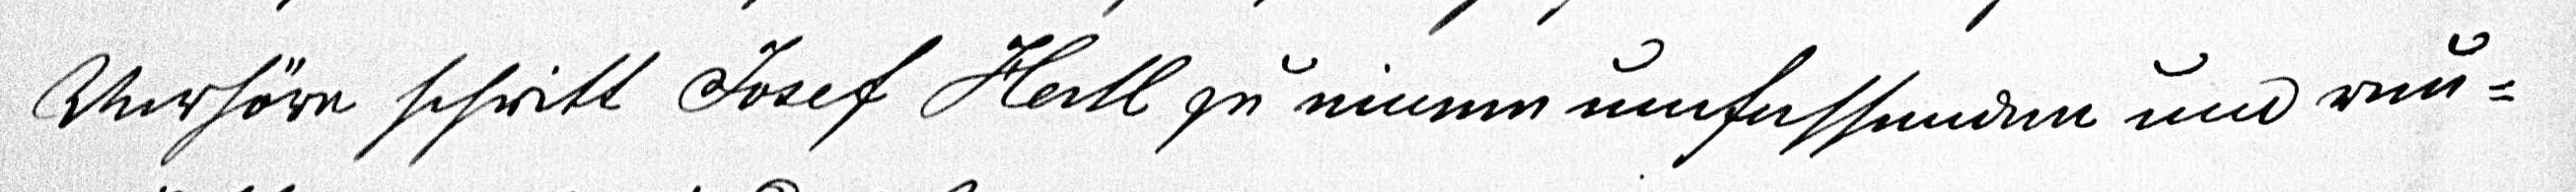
Verhöre schritt Josef Hertl zu einem umfassenden und reu¬
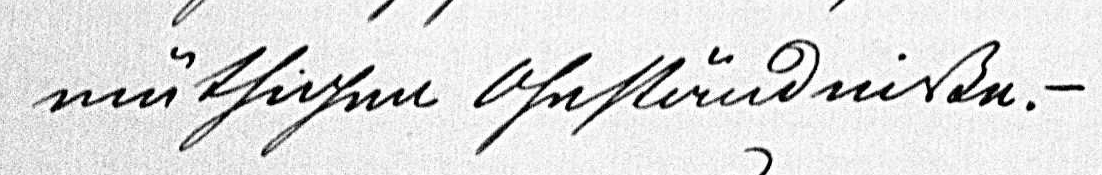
müthigen Geständniße.
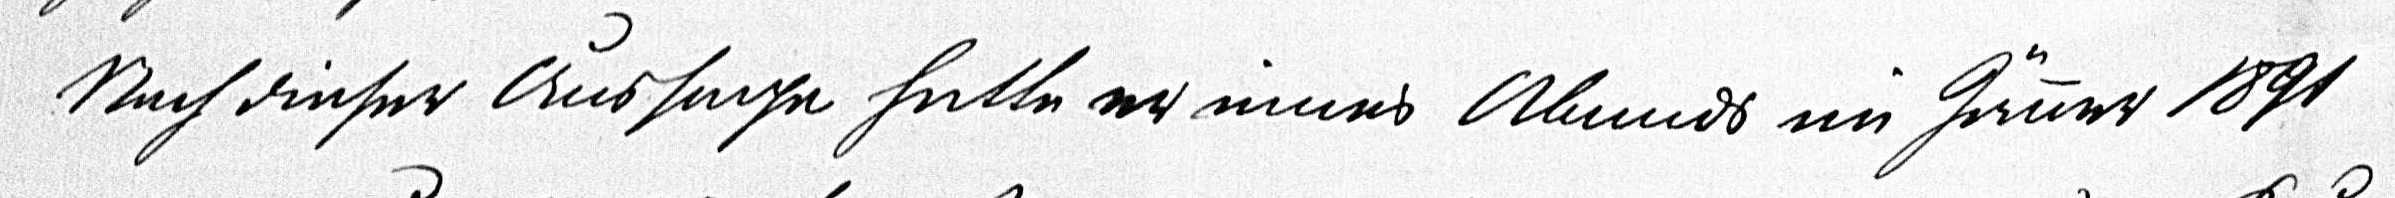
Nach dieser Aussage hatte er eines Abends im Jänner 1891
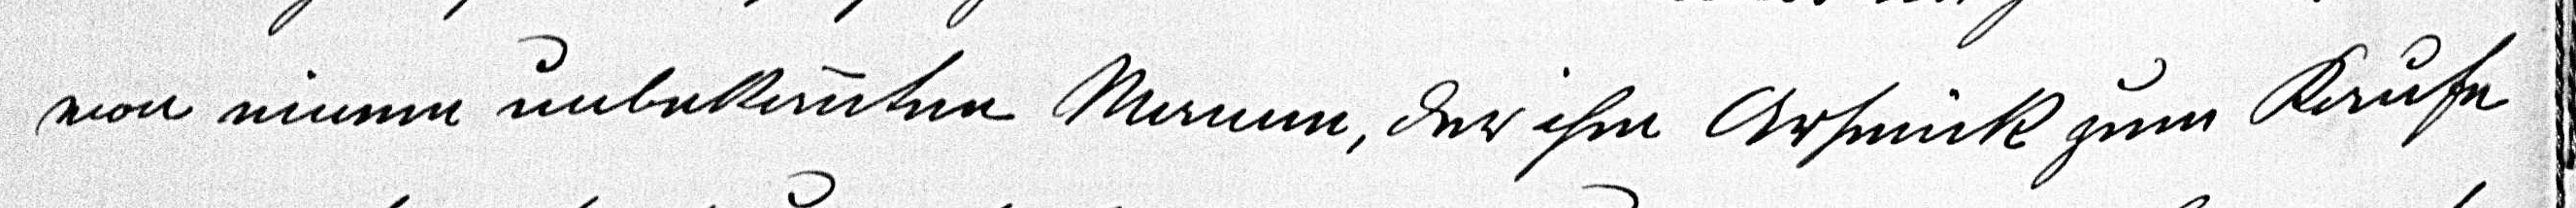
von einen unbekannten Manne, der ihm Arsenik zum Kaufe
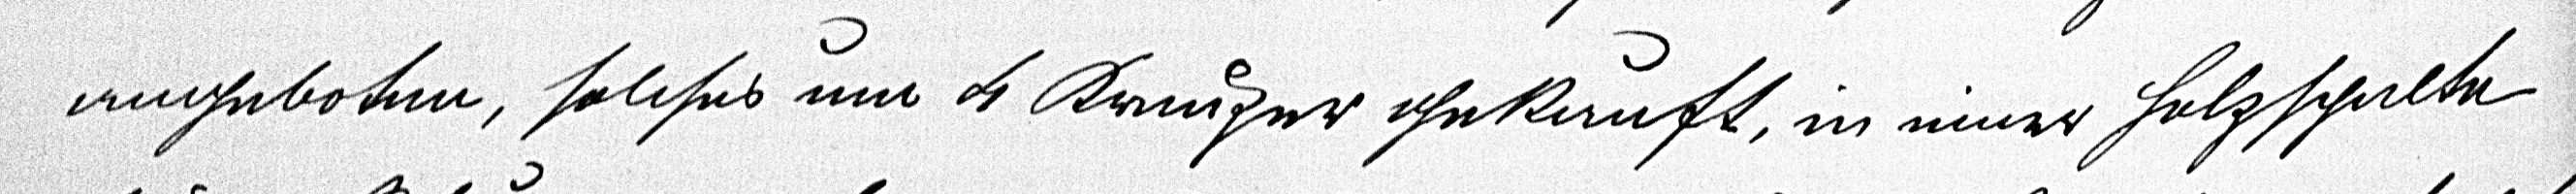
angeboten, solches um 4 Kreuzer gekauft, in einer Holzspalte
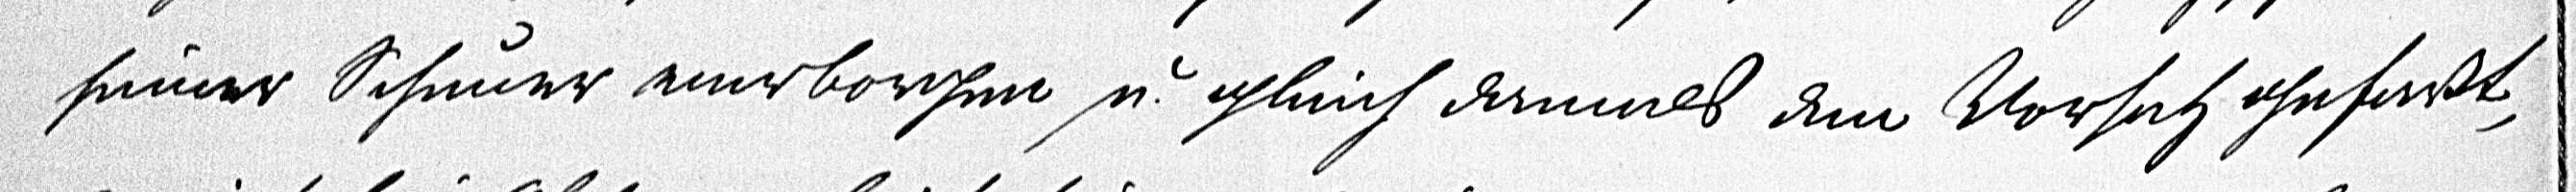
seiner Scheune verborgen u. gleich damals den Vorsatz gefaßt,
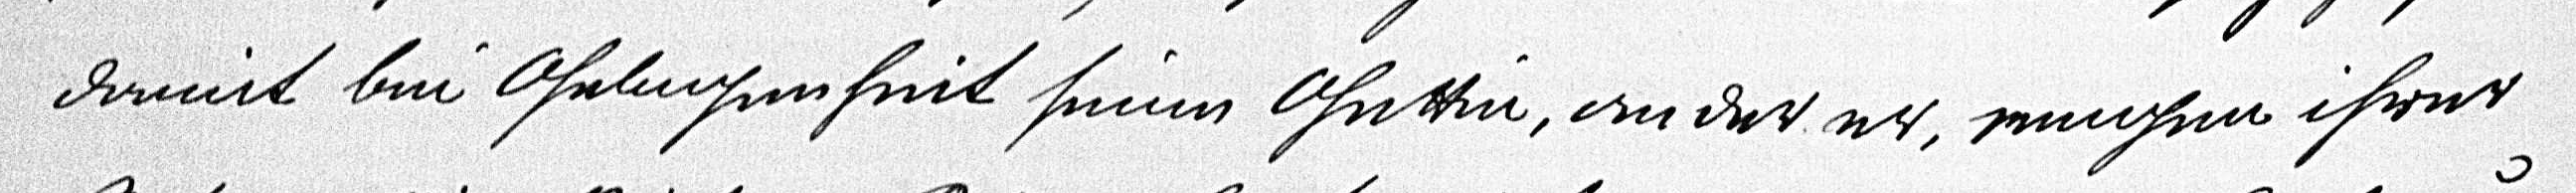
damit bei Gelegenheit seine Gattin, an der er, wegen ihrer
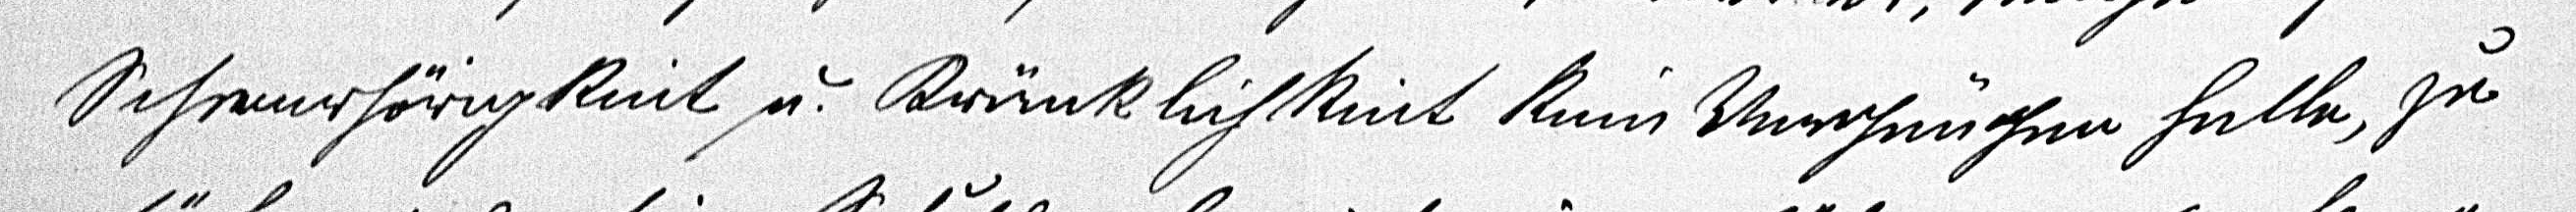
Schwerhörigkeit u. Kränklichkeit kein Vergnügen hatte, zu
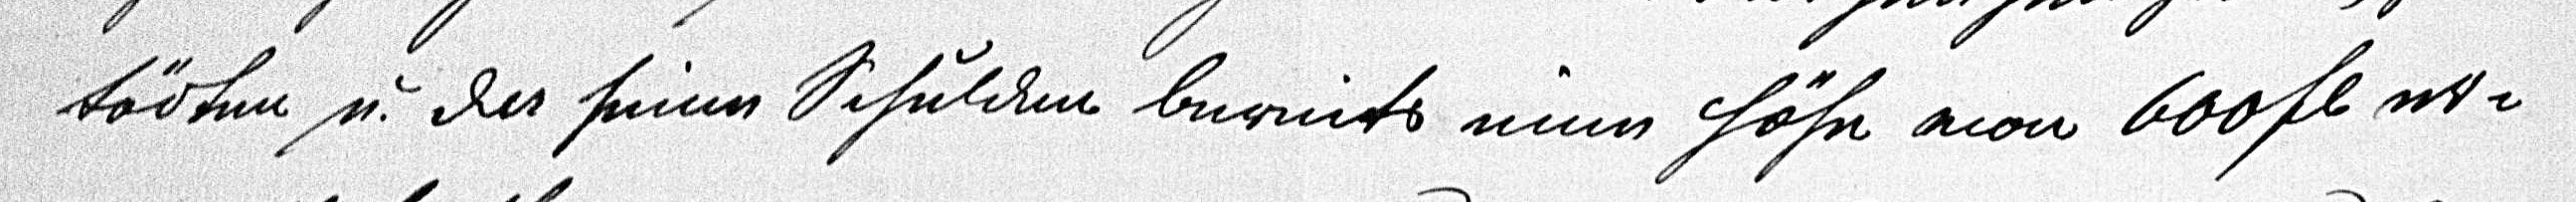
tödten u. der seine Schulden bereits eine Höhe von 600 fl er¬
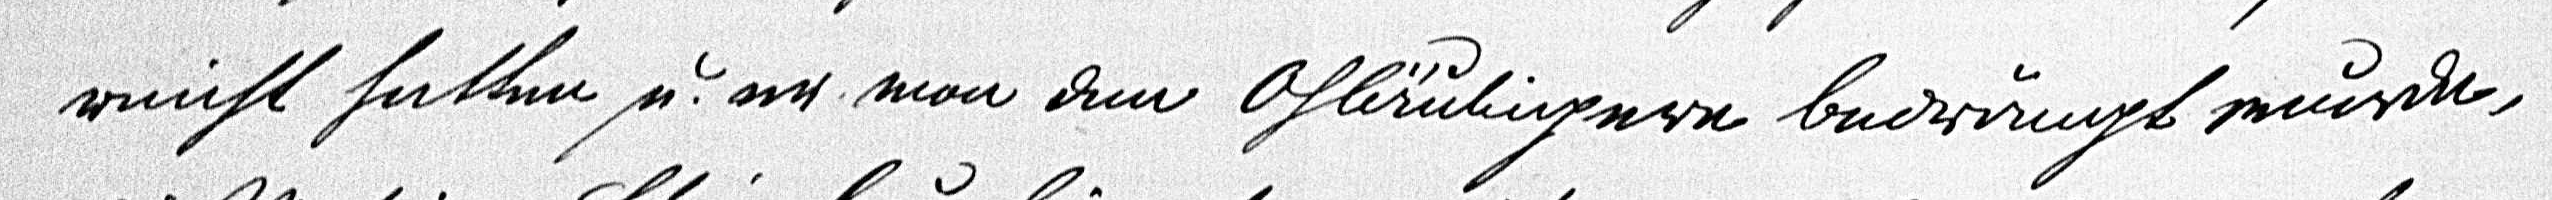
reicht hatten u. er von dem Gläubigern bedrängt wurde,
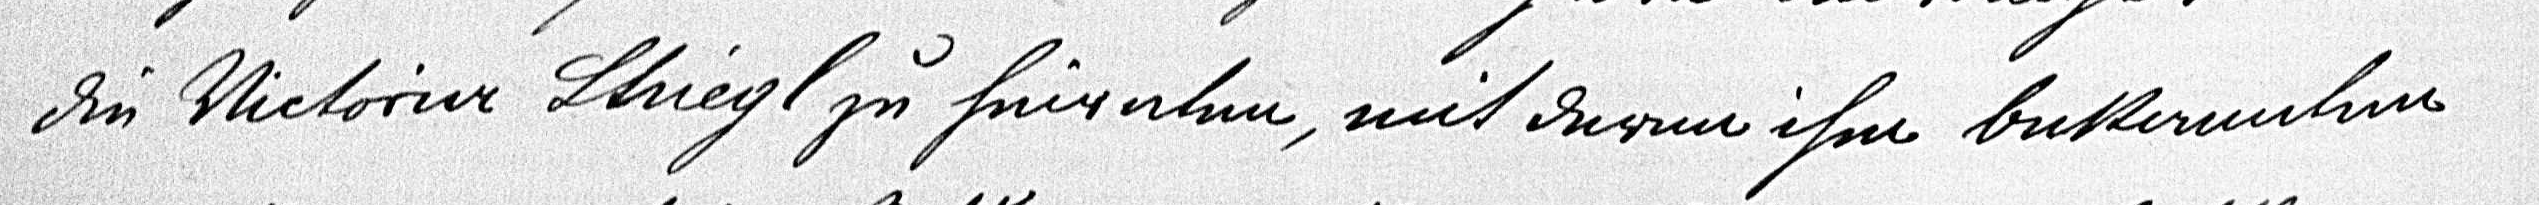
die Victoria Striegl zu heiraten, mit deren ihm bekannten
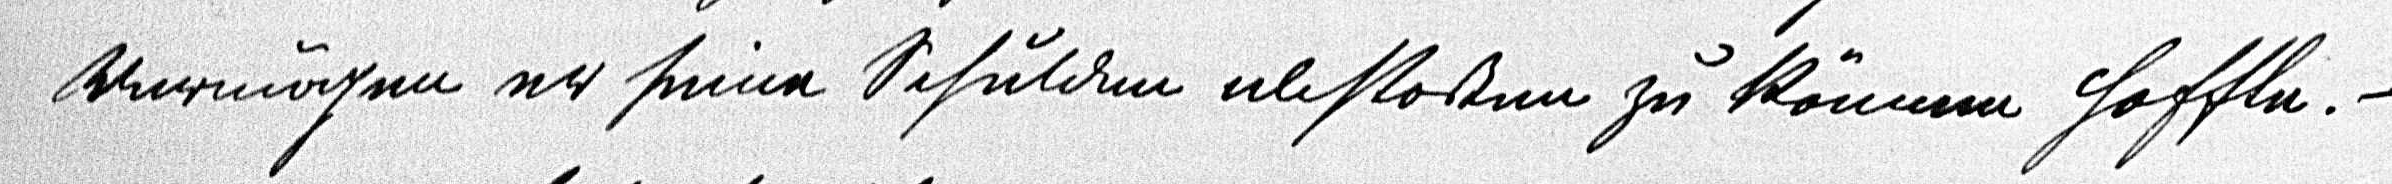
Vermögen er seine Schulden abstoßen zu können hoffte.
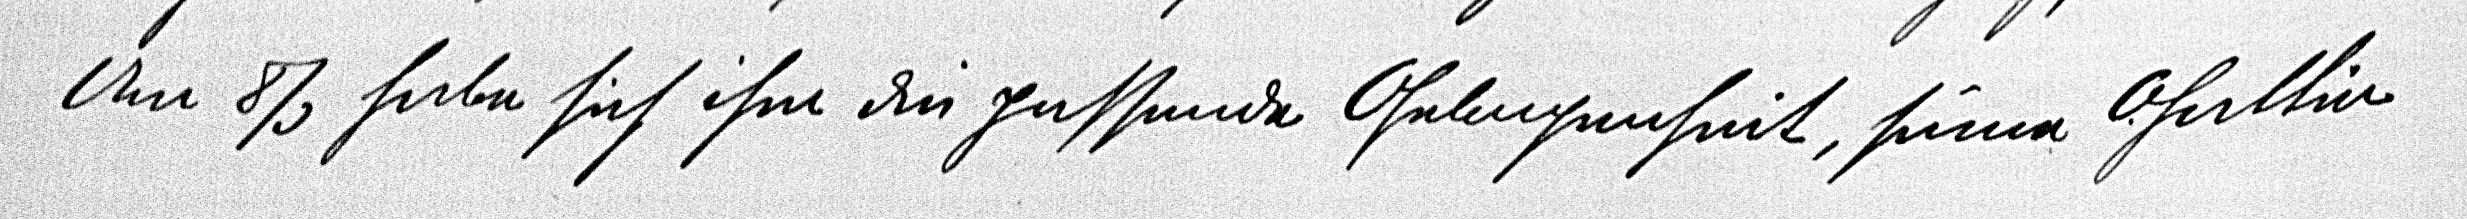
Um 8/3 haben sich ihm die passende Gelegenheit, seine Gattin
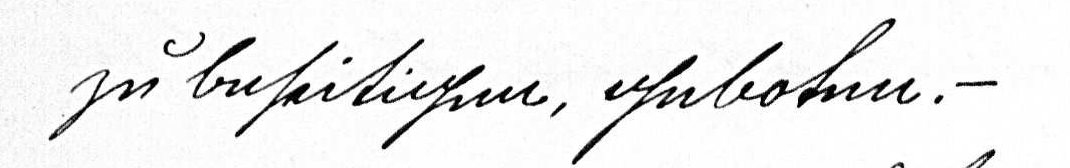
zu beseitigen, geboten. –
